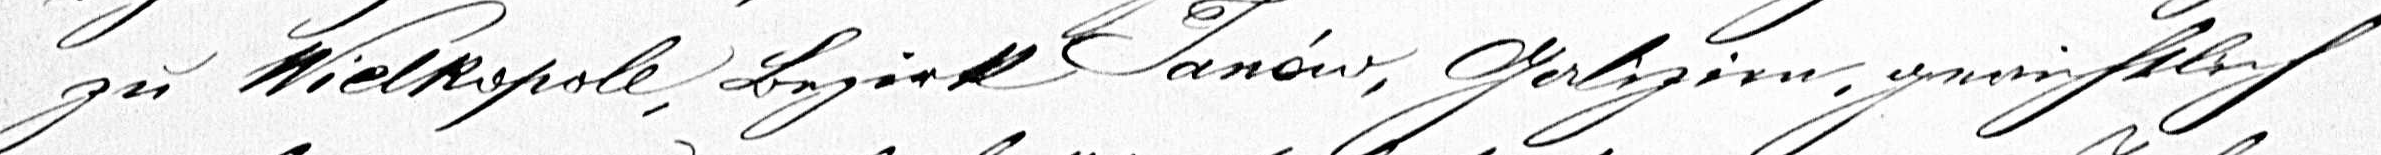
zu Wielkopoll, Bezirk Tanów, Galizien, gerichtlich
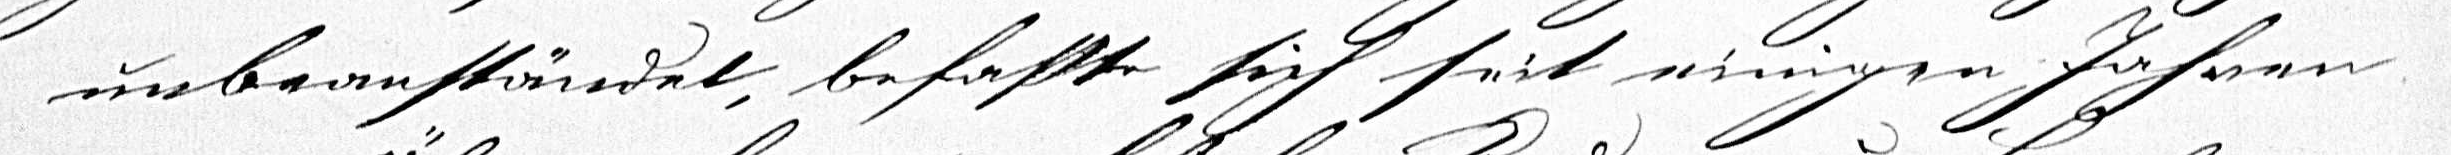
unbeanständet, befaßte sich seit einigen Jahren
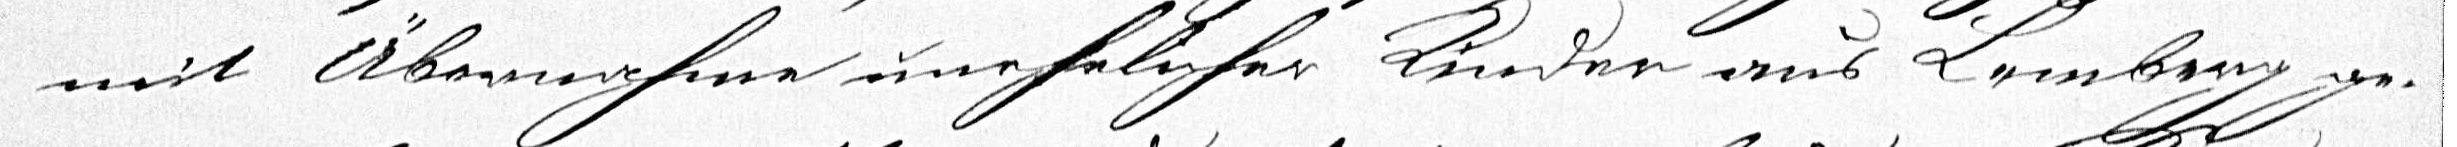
mit Übernahme unehelicher Kinder aus Lemberg ge¬
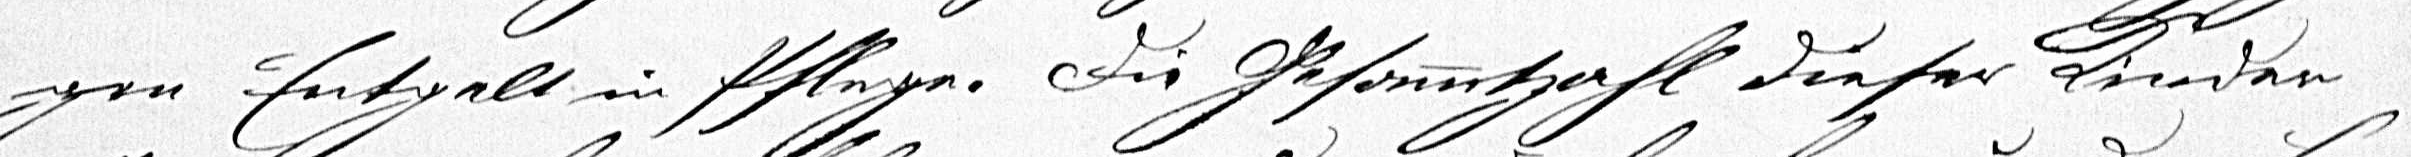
gen Entgelt in Pflege. Die Gesammtzahl dieser Kinder
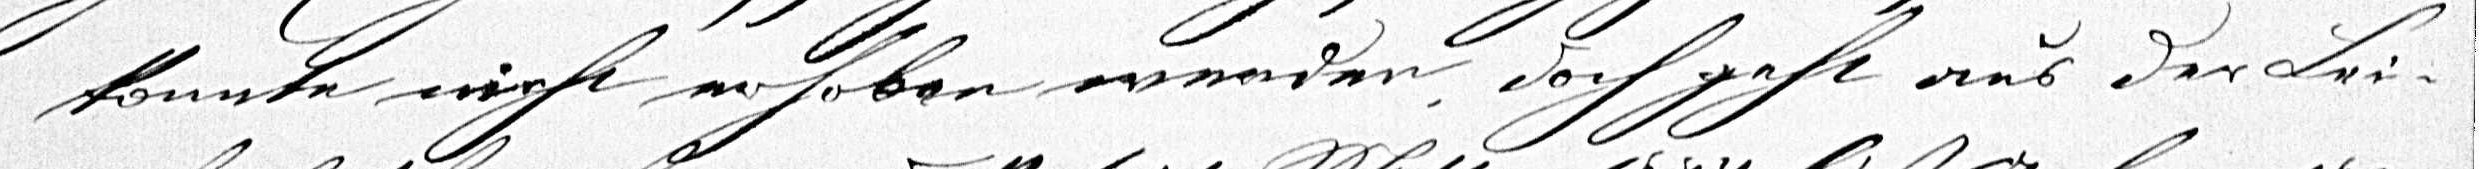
konnte nicht erhoben werden, doch geht aus der Lei¬
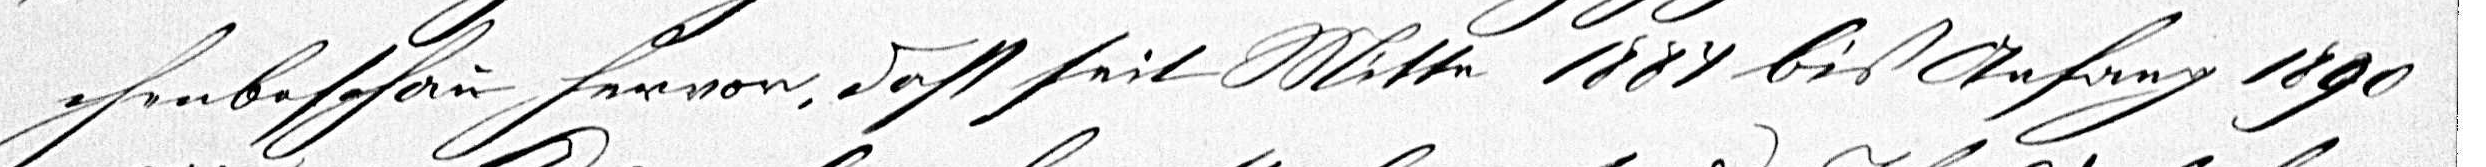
chebeschau hervor, daß seit Mitte 1884 bis Anfang 1890
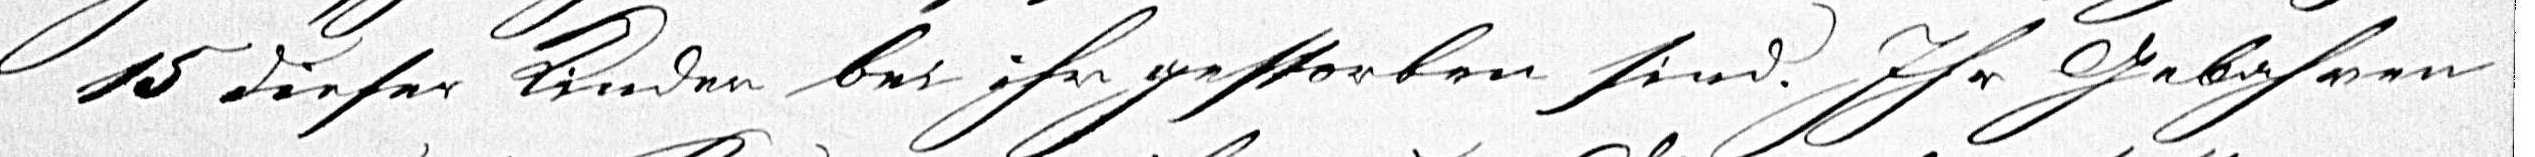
15 dieser Kinder bei ihr gestorben sind. Jhr Gebahren
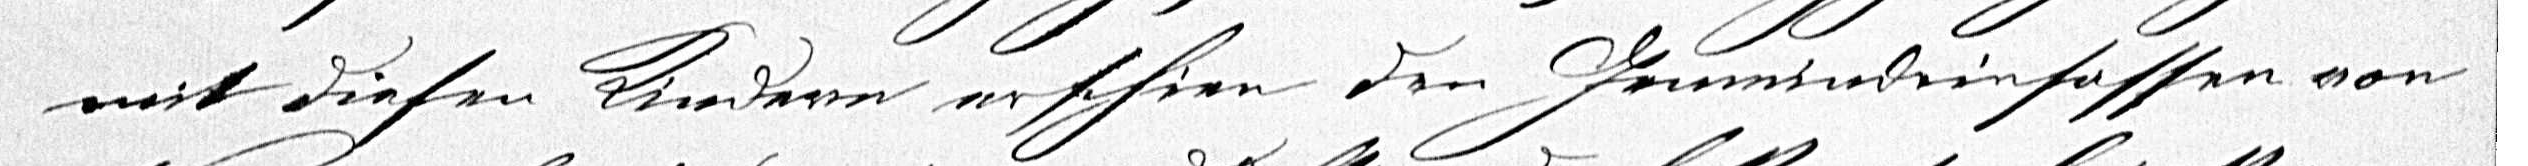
mit diesen Kindern erschien den Gemeindeinsassen von
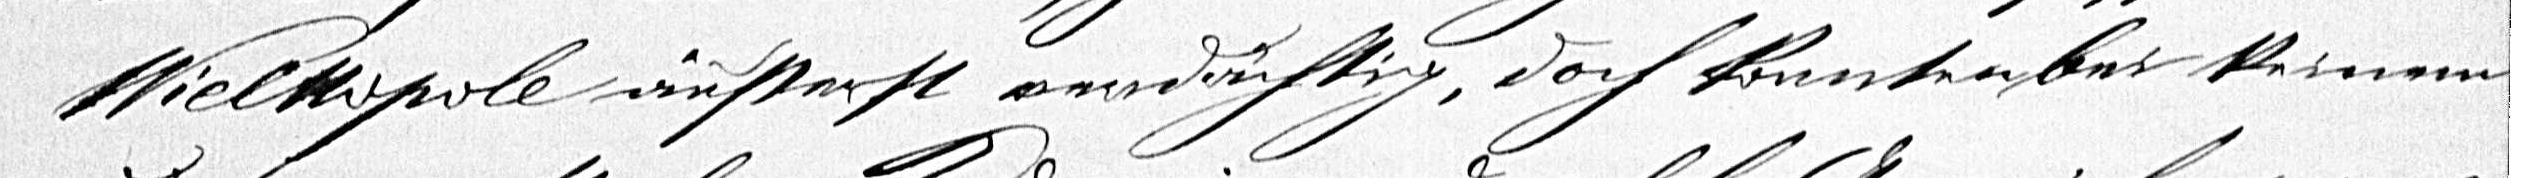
Wielkopole äußerst verdächtig, doch konnten bei keinem
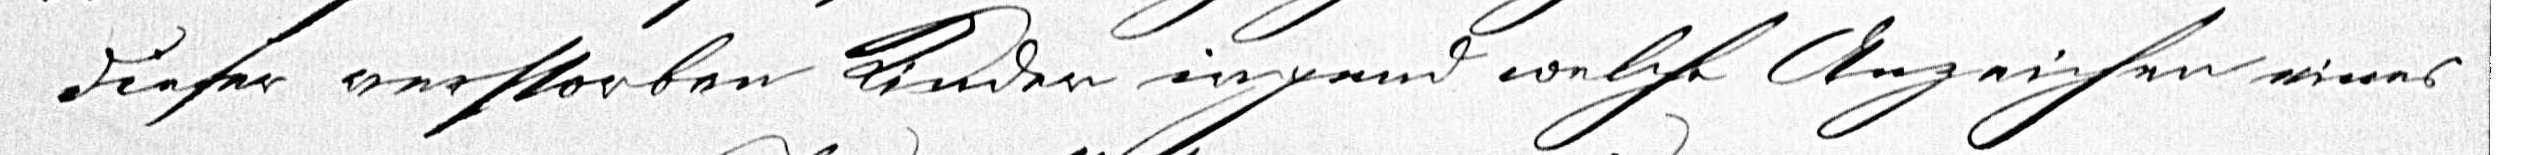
dieser verstorben Kinder irgend welche Anzeichen eines
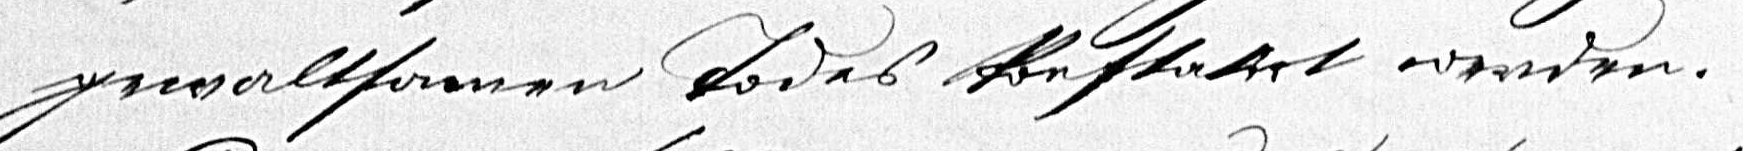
gewaltsamen Todes konstaxx werden.
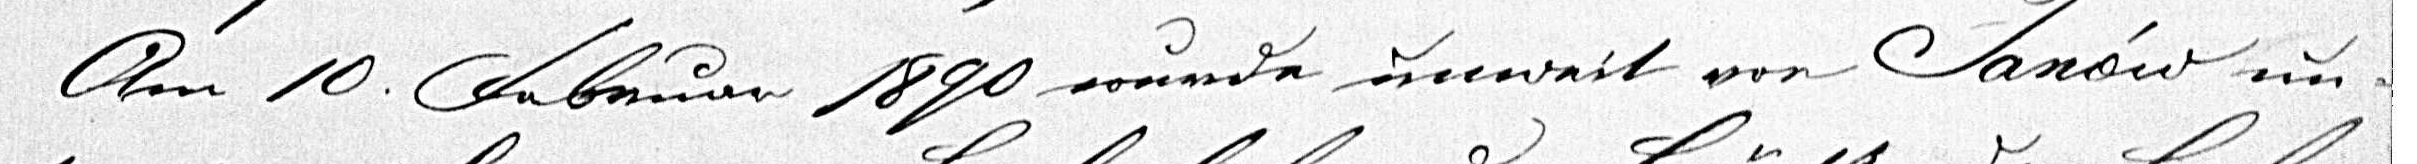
Am 10. Februar 1890 wurde unweit von Tanów un¬
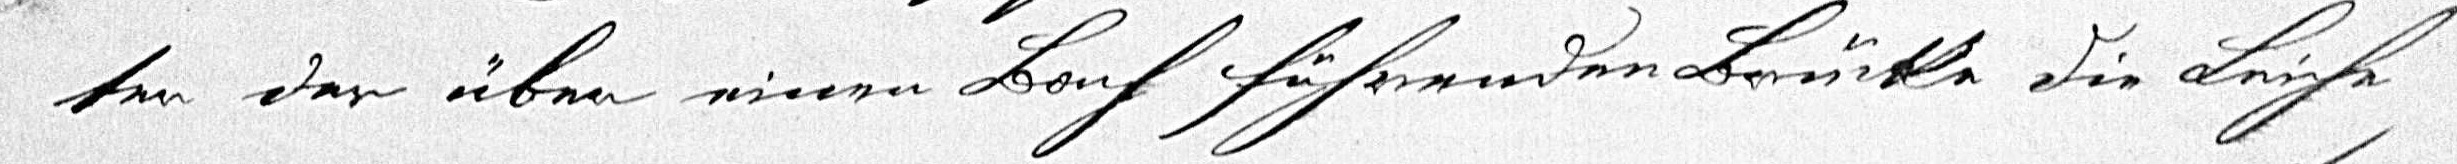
ter der über einen Bxx führenden Brücke die Leiche
